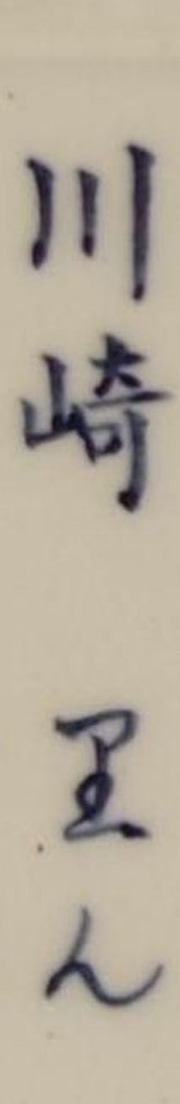川崎りん

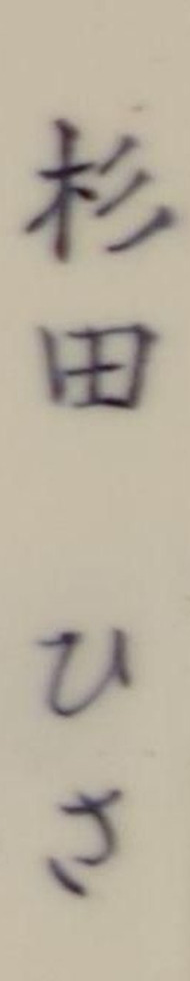杉田ひさ
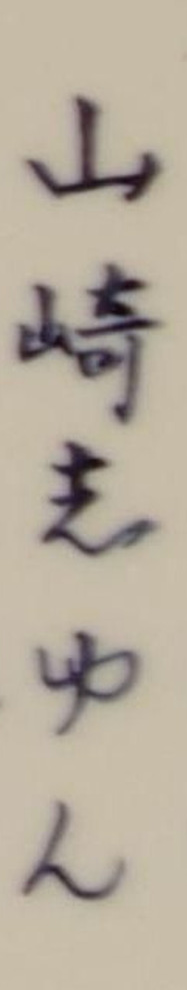山崎しゆん
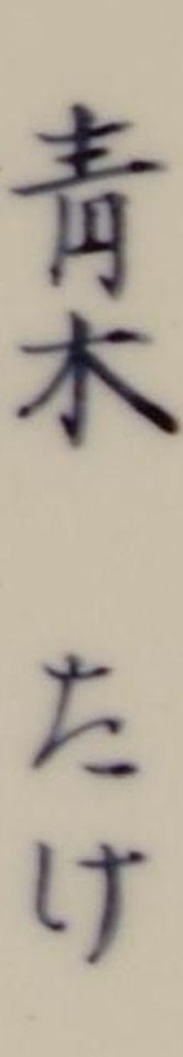青木たけ
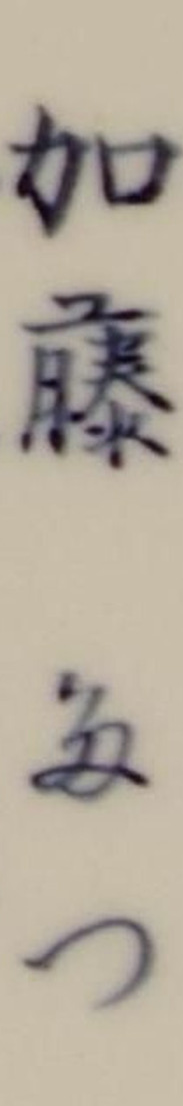加藤たつ
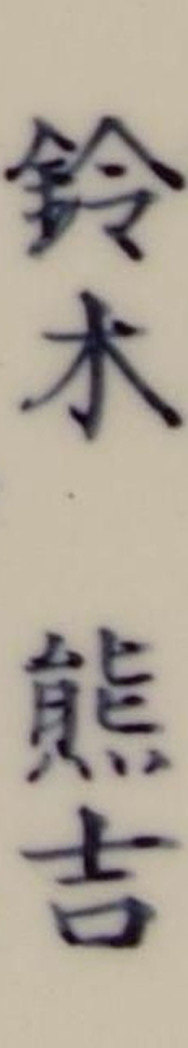鈴木熊吉
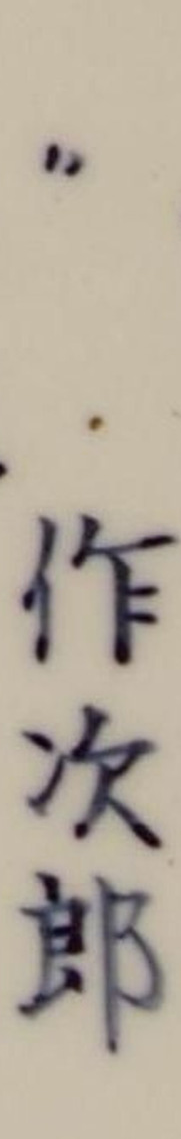作次郎
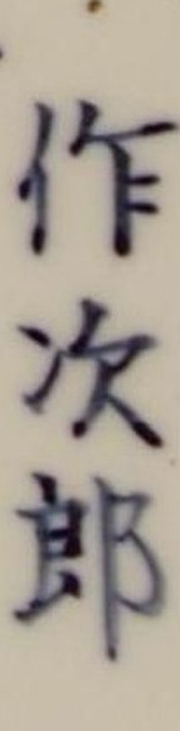作次郎
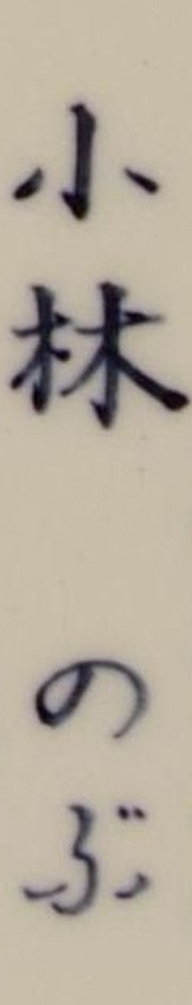小林のぶ
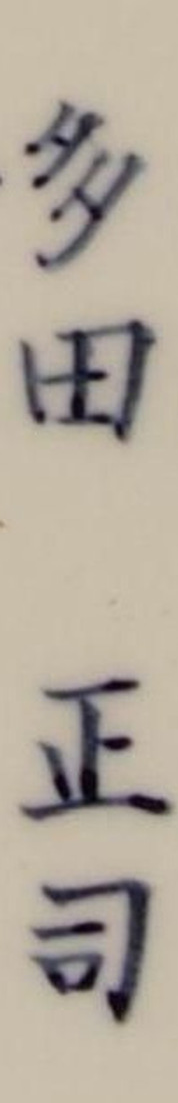多田正司
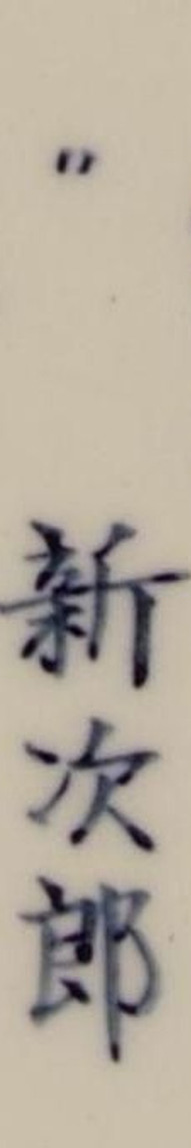新次郎
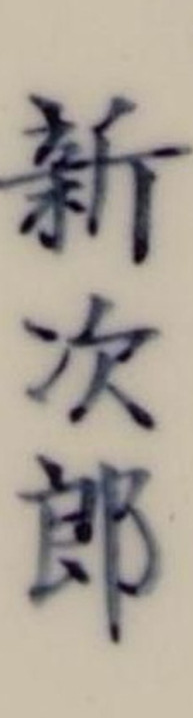新次郎
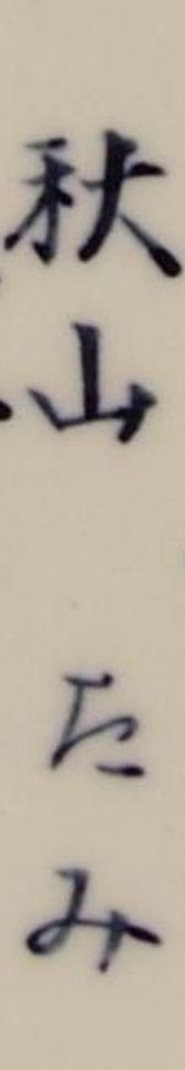秋山たみ
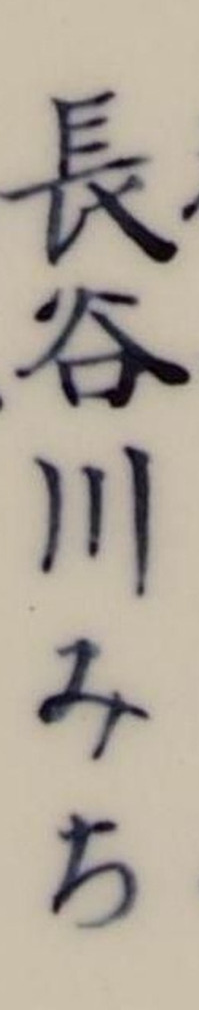長谷川みち
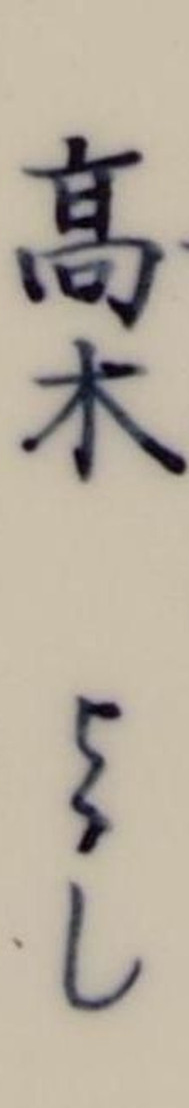高木よし
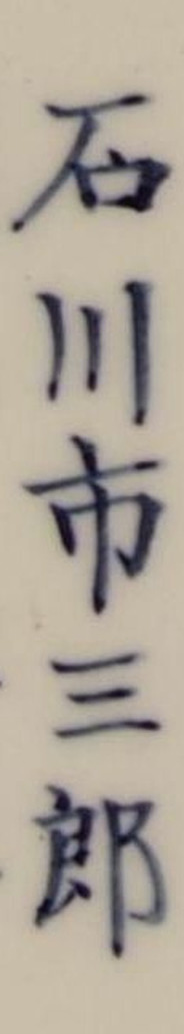石川市三郎
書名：M~S
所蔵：高野山金剛峯寺
